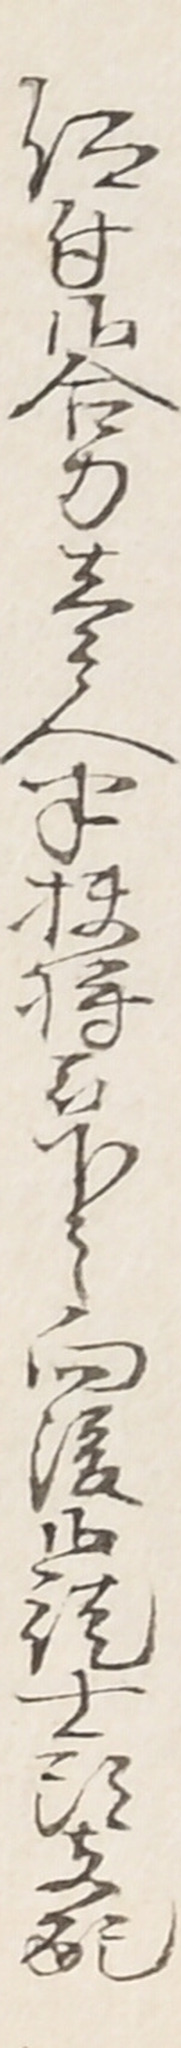仰付御合力壱人半扶持被下之向後御徒士頭支配
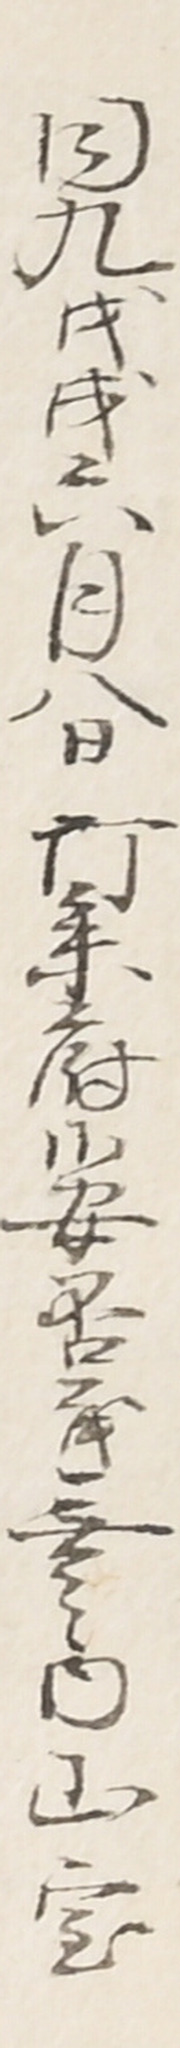一同九戊戌六月八日御参府御安否茂無之内山室
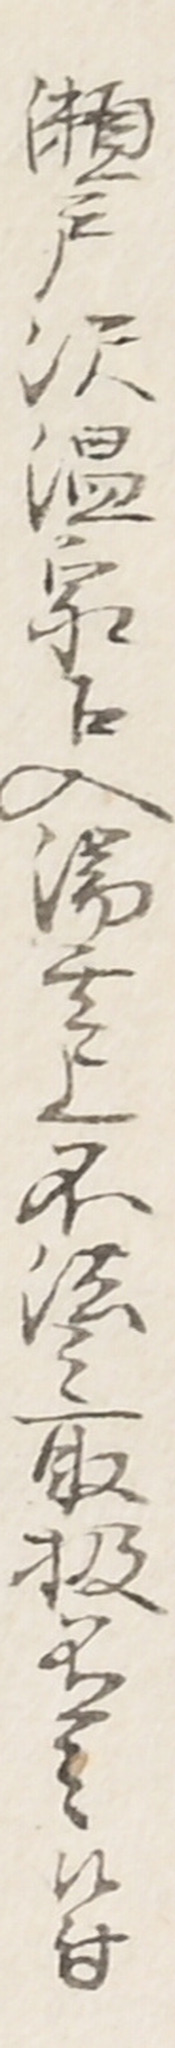瀬戸沢温泉江入湯其上不法之取扱有之候付
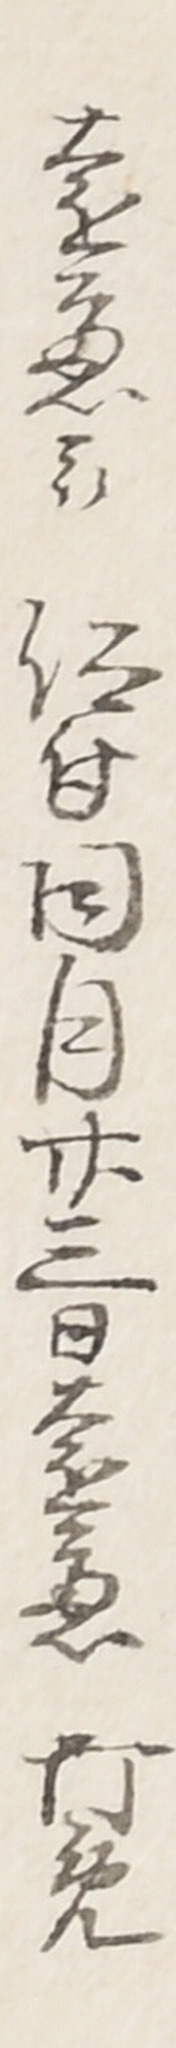遠慮被仰付同月廿三日遠慮御免
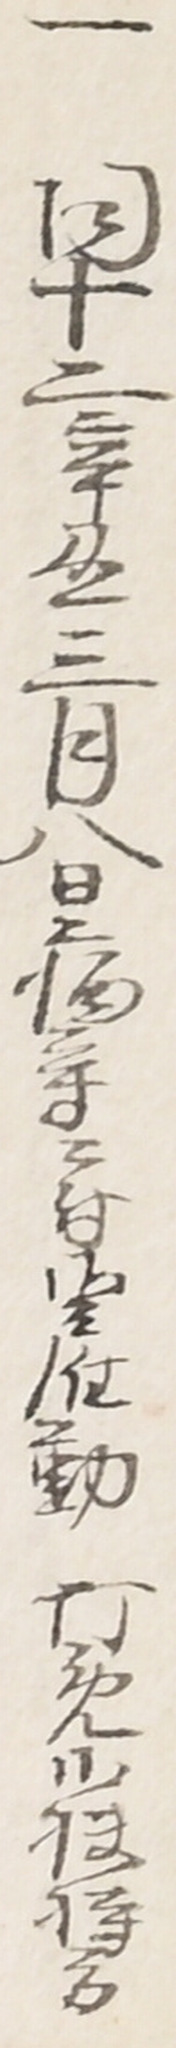一同十二辛丑三月八日病気ニ付御雇勤御免御扶持方
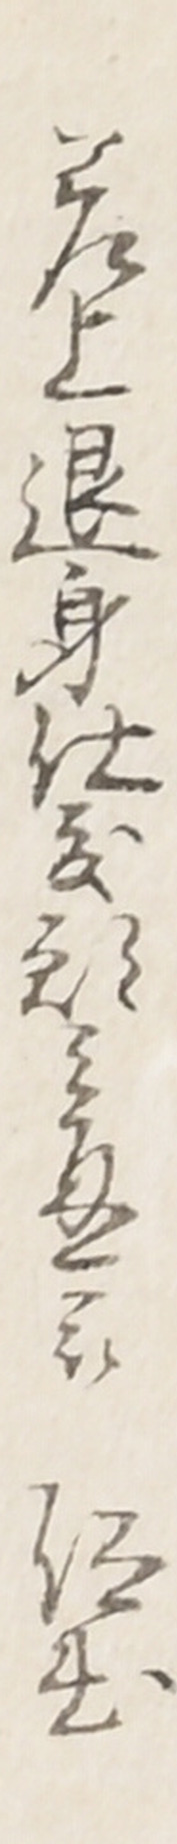差上退身仕度願之通被仰出
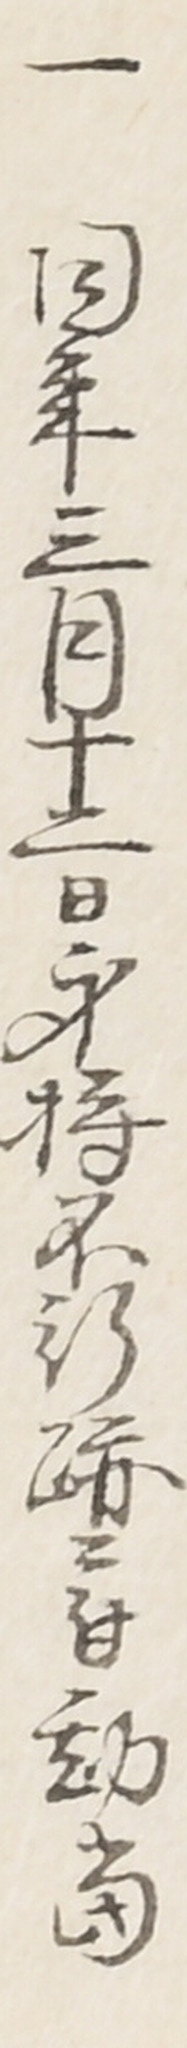一同年三月十二日身持不行跡ニ付勘当
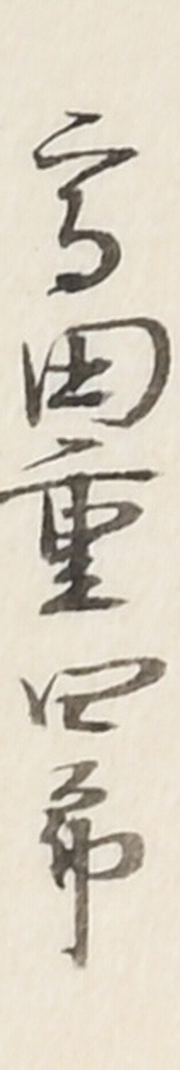高田重四郎
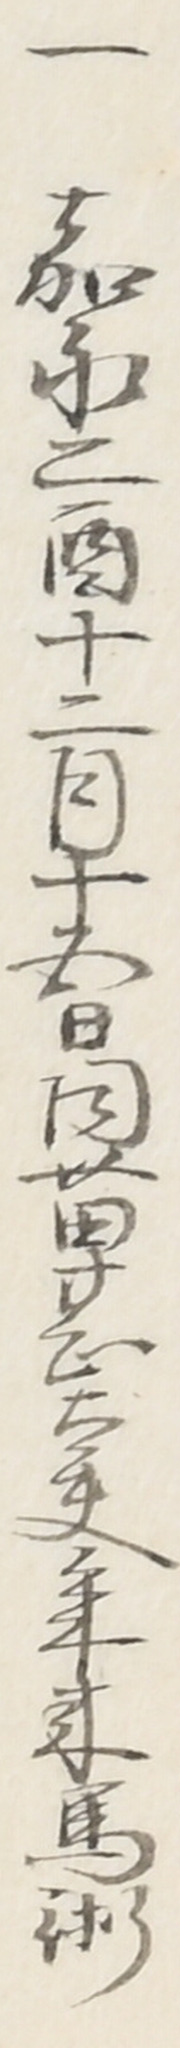一嘉永二酉十二月十五同苗甚太夫年来馬術
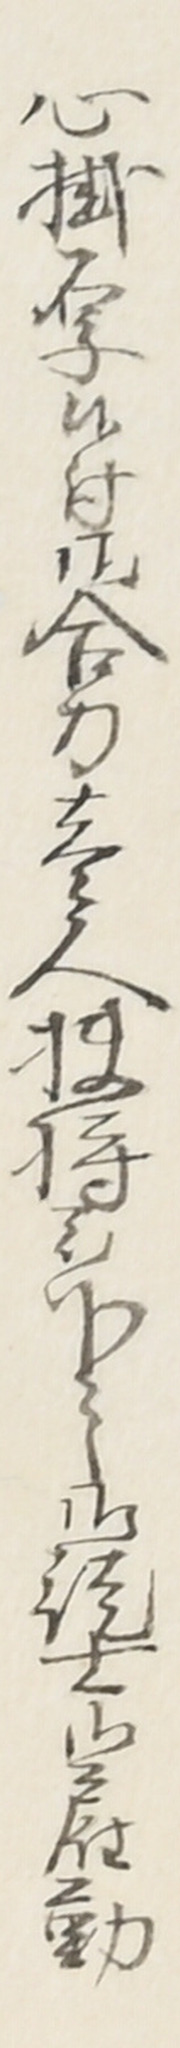心掛厚候付御合力壱人扶持被下之御徒士御雇勤
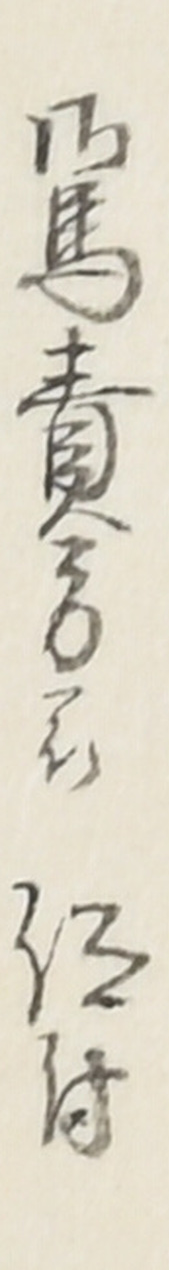御馬責方被仰付
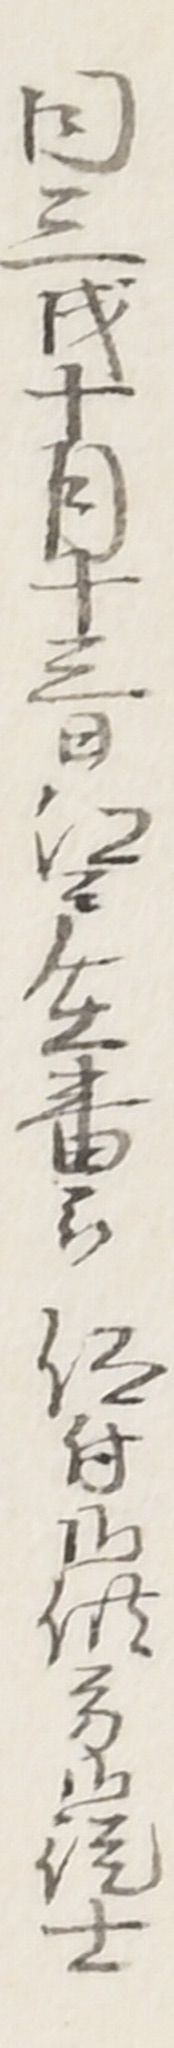一同三戌十月十三日江戸在番被仰付御供方御徒士
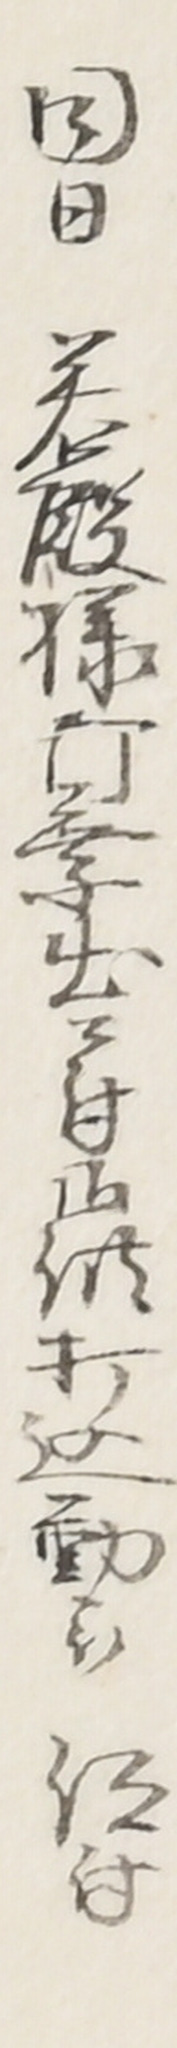同日若殿様御乗出ニ付御供打込勤被仰付
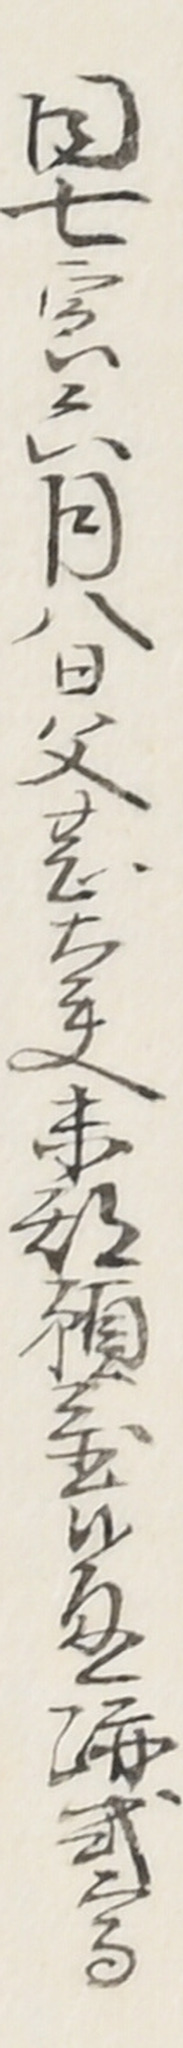一同七寅六月八日父甚太夫末期願置候通跡式高
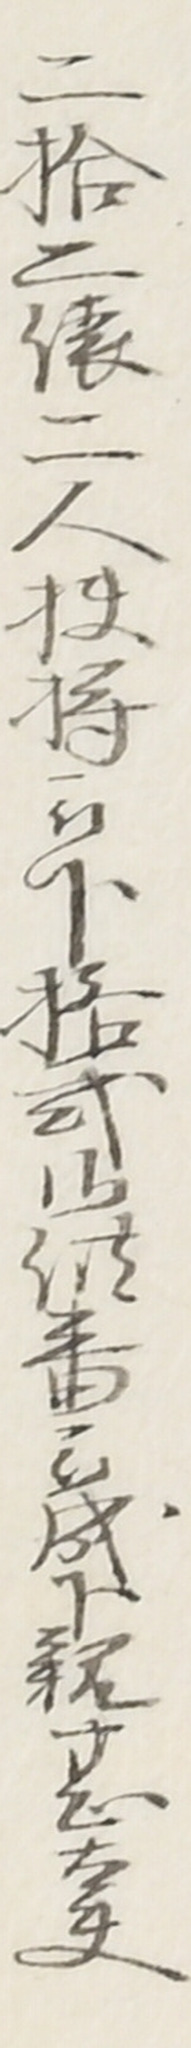二拾二俵二人扶持被下格式御供番被成下親甚太夫
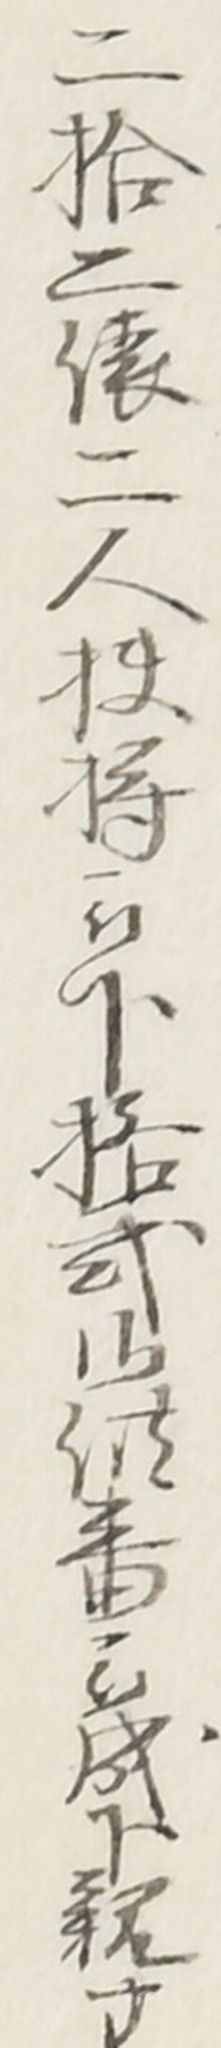二拾二俵二人扶持被下格式御供番被成下親甚太夫
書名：無足諸士勤仕録（四）
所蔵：伊那市立高遠町図書館・合同会社AMANE
